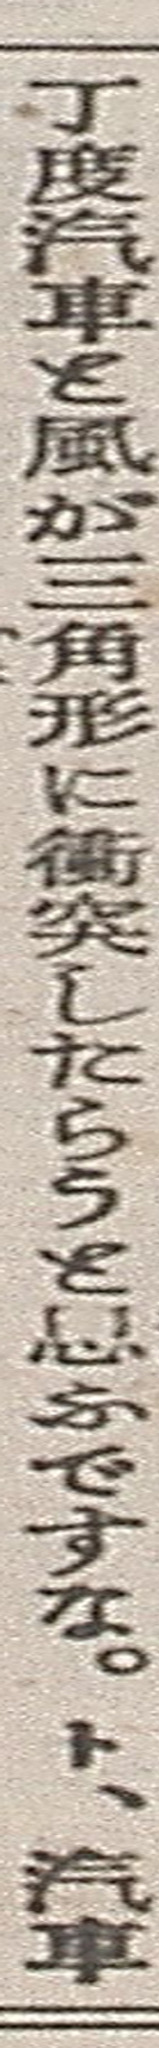丁度汽車と風が三角形に衝突したらうと思ふですな。ト、汽車
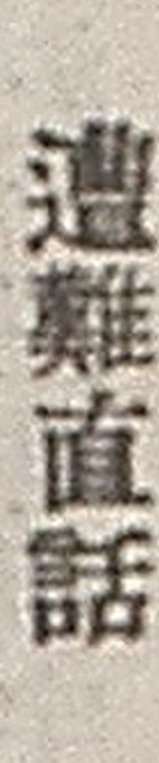遭難直話
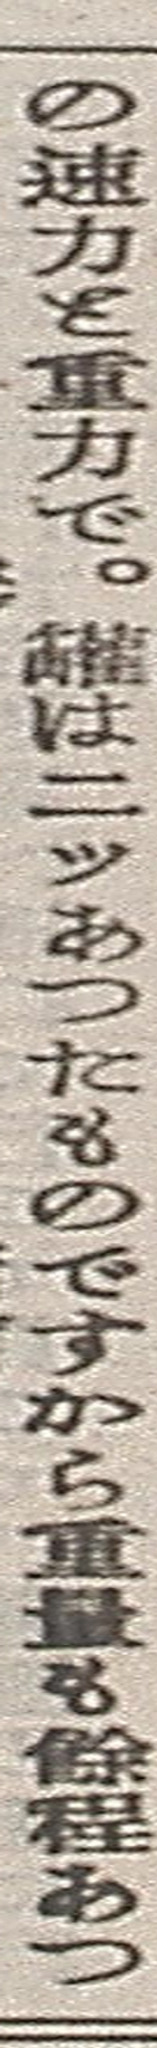の速力と重力で。罐は二ツあつたものですから重量も余程あつ
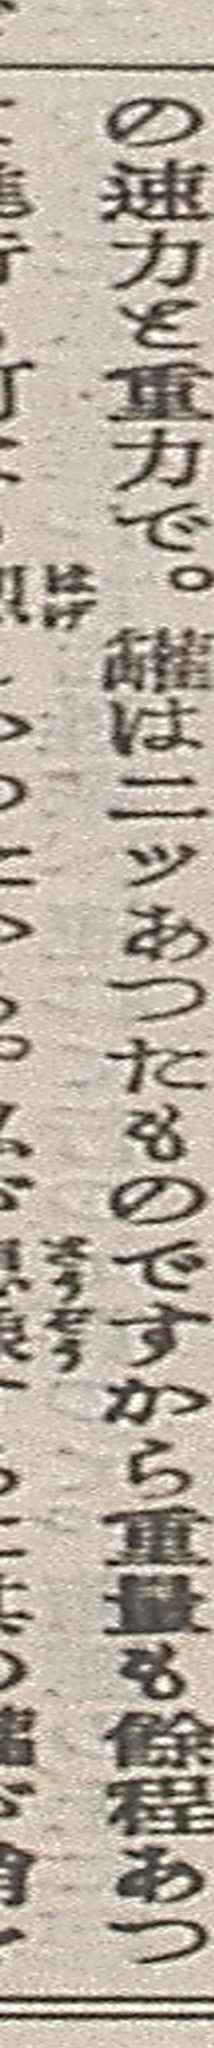の速力と重力で。罐は二ツあつたものですから重量も余程あつ
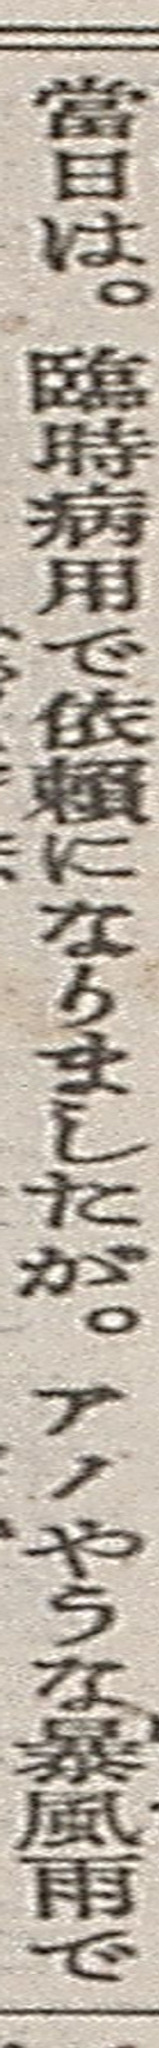当日は。臨時病用で依頼になりましたが。アノやうな暴風雨で
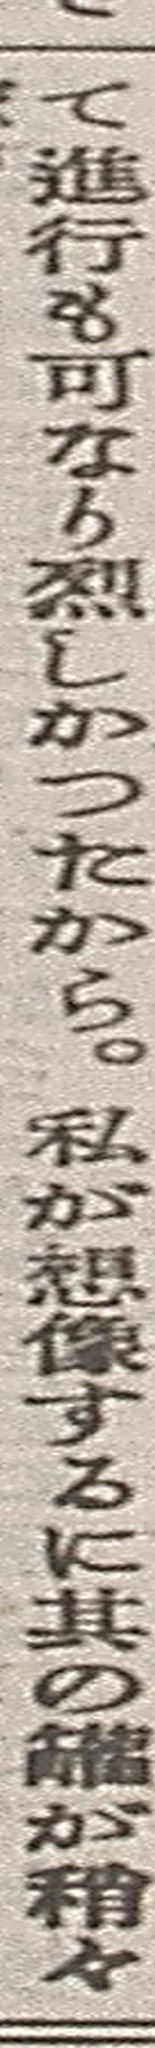て進行も可なり烈しかつたから。私が想像するに其の罐が稍々
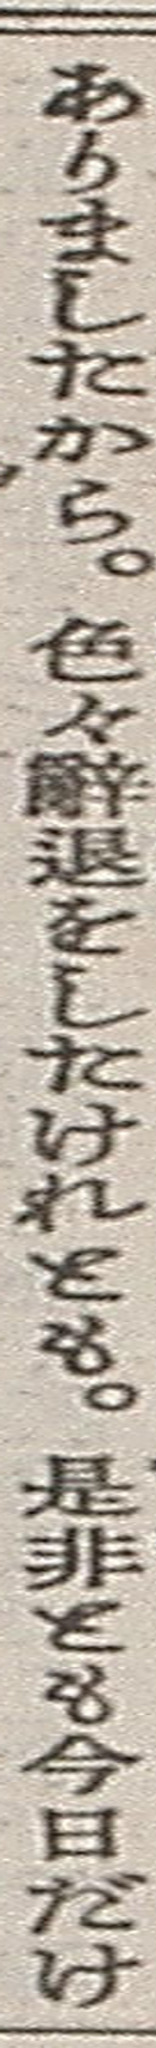ありましたから。色々辞退をしたけれとも。是非とも今日だけ
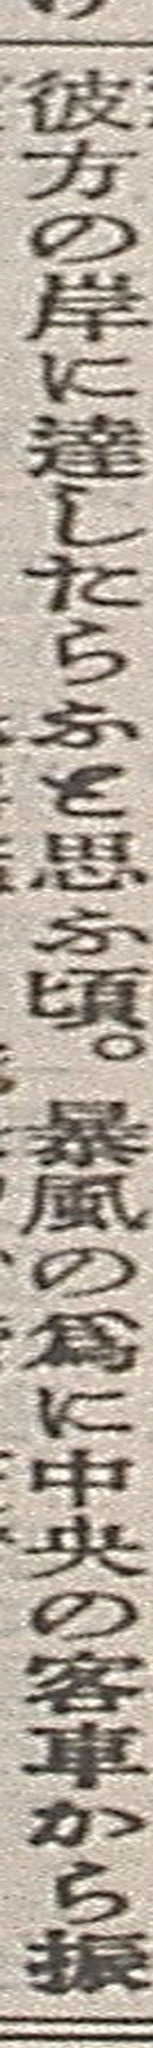彼方の岸に達したらふと思ふ頃。暴風の為に中央の客車から振
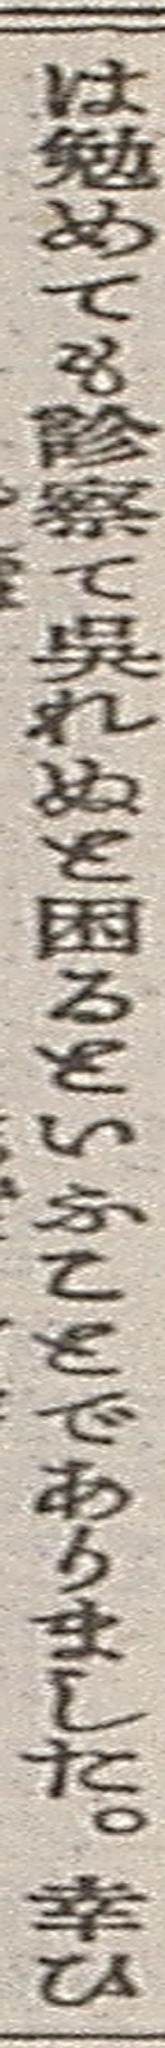は勉めても診察て呉れぬと困るといふことでありました。幸ひ
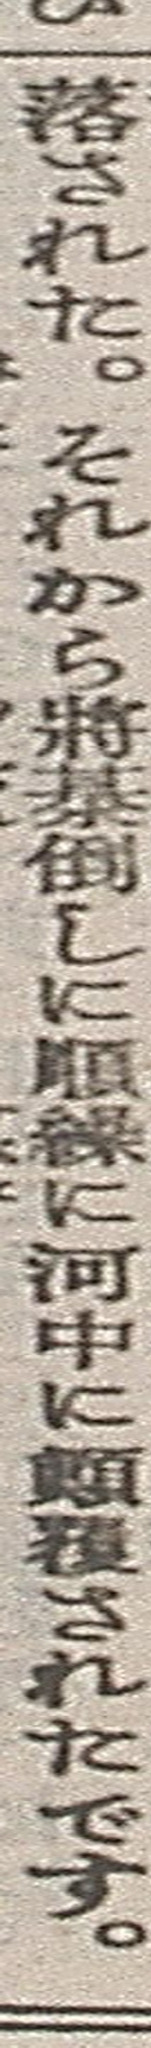落された。それから将棋倒しに順繰に河中に顛覆されたです。
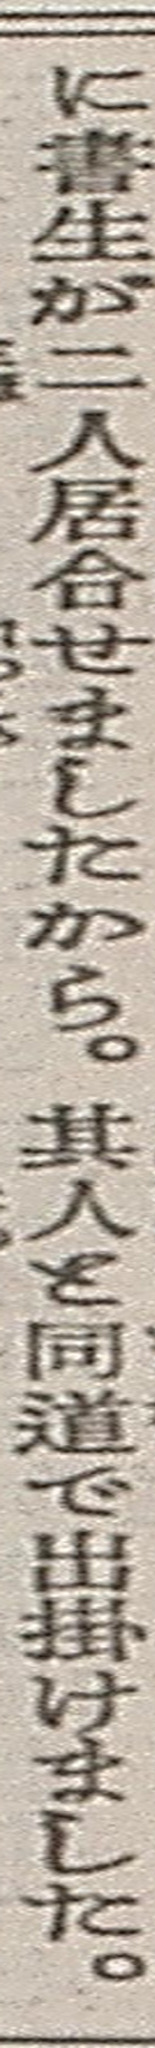に書生が二人居合せましたから。其人と同道で出掛けました。
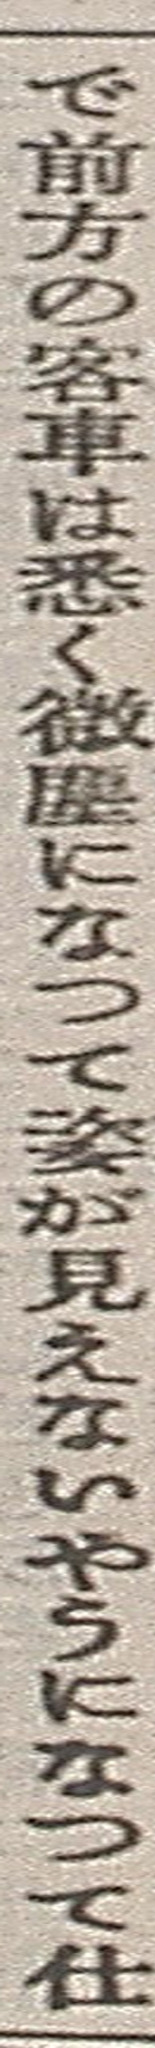で前方の客車は悉く微塵になつて姿が見えないやうになつて仕
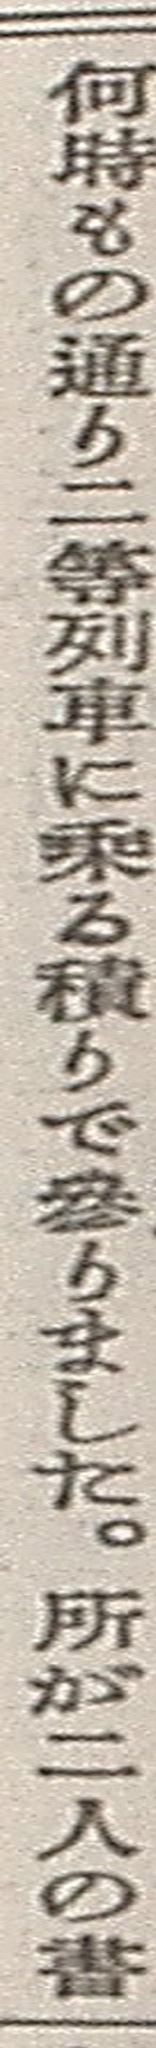何時もの通り二等列車に乗る積りで参りました。所が二人の書
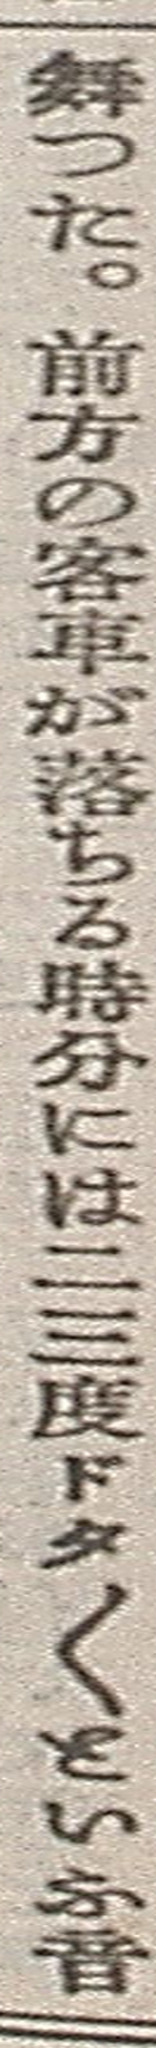舞つた。前方の客車が落ちる時分にはニ三度ドタ〳〵といふ音
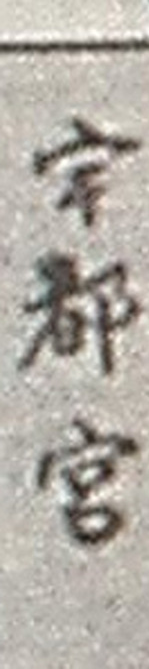宇都宮
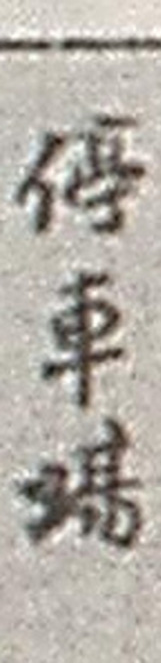停車場
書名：風俗畫報臨時増刊第百九十九號　明治三十二年十月各地災害圖會（前編之續）
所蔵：東京大学地震研究所図書室 Earthquake Research Institute Library, The University of Tokyo, JAPAN
